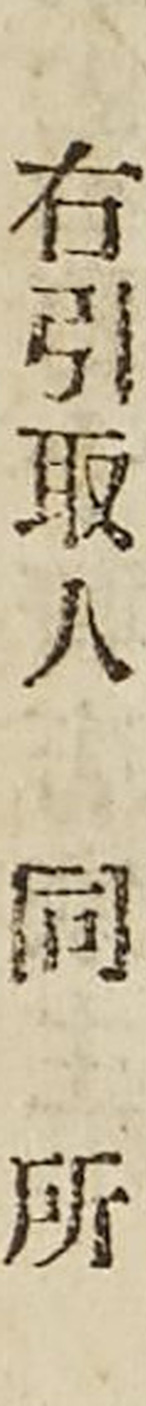右引取人同同
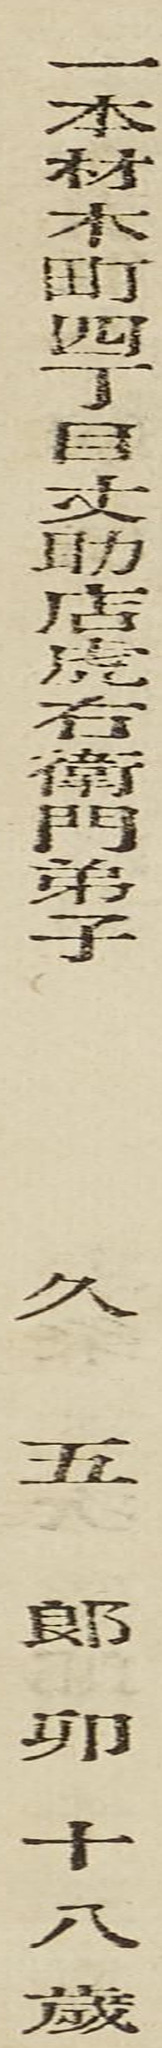一本材木町四丁目丈助店虎右衛門弟子久五郎卯十八歳
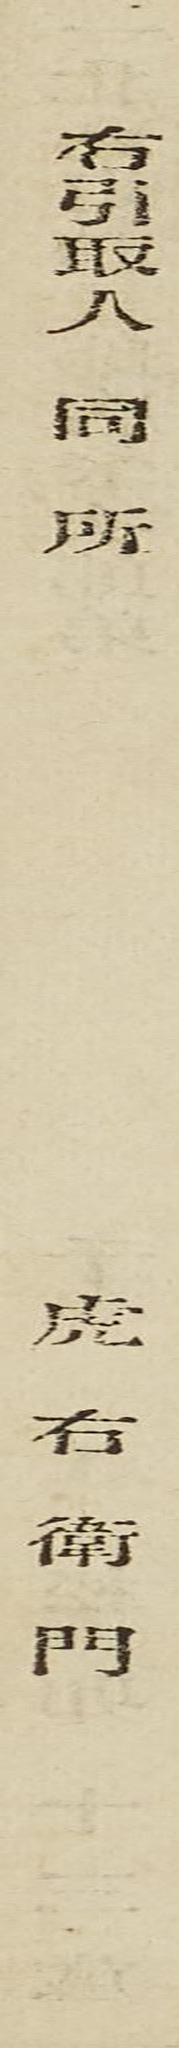右引取人同所虎右衛門
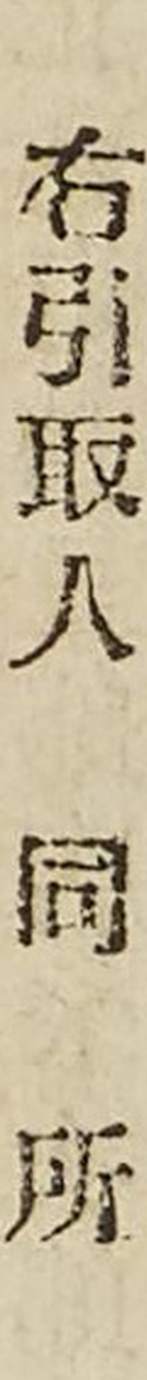右引取人同同

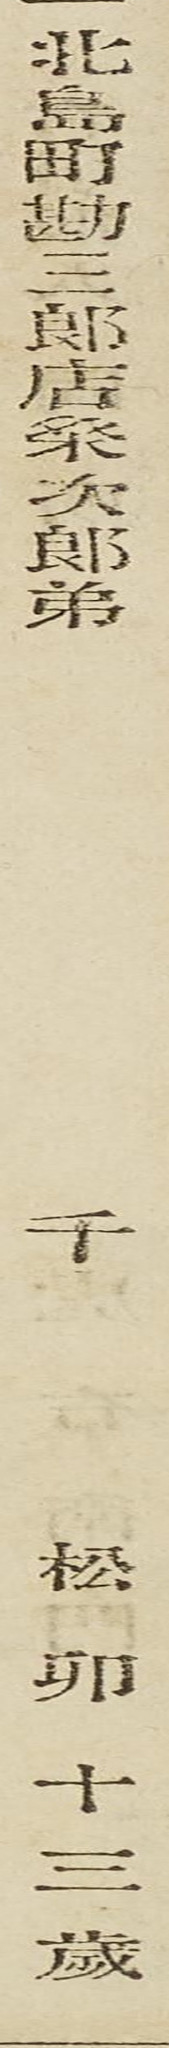一北島町勘三郎店粂次郎弟千松卯十三歳
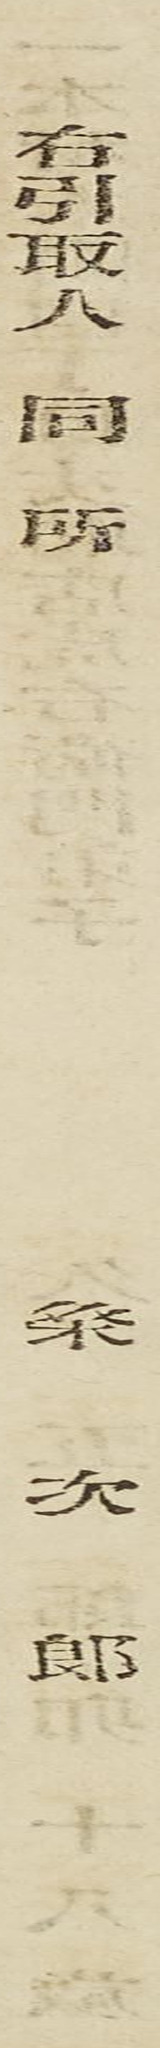右引取人同所粂次郎
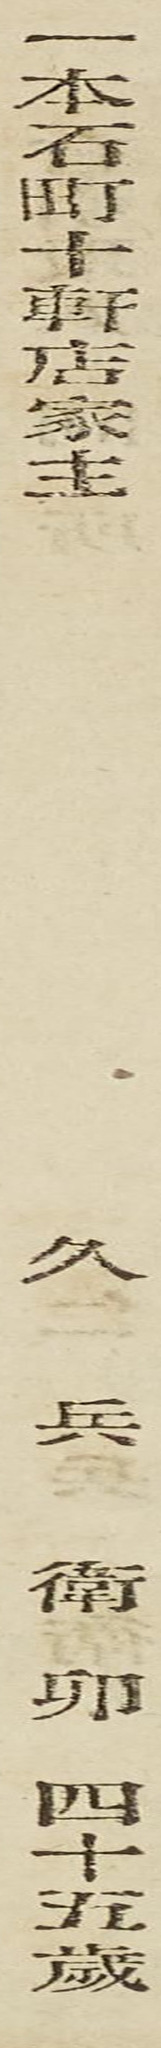一本石町十軒店家主久兵衛卯四十五歳
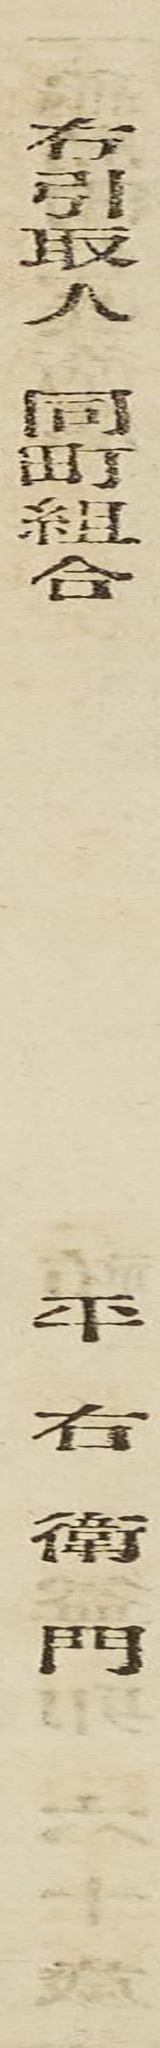右引取人同町組合平右衛門
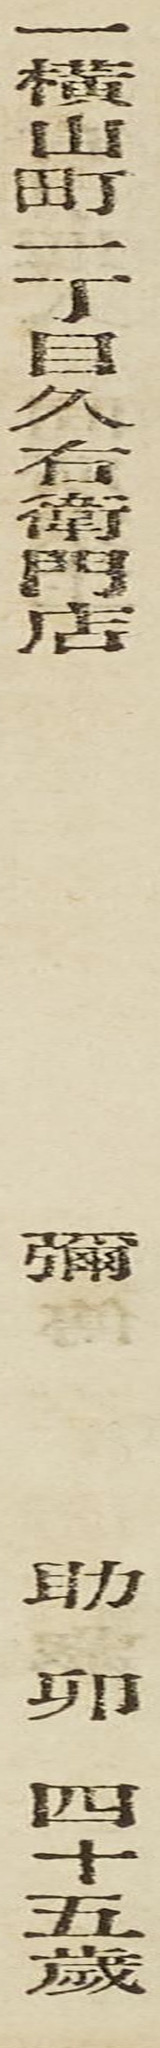一横山町一丁目久右衛門店彌助卯四十五歳
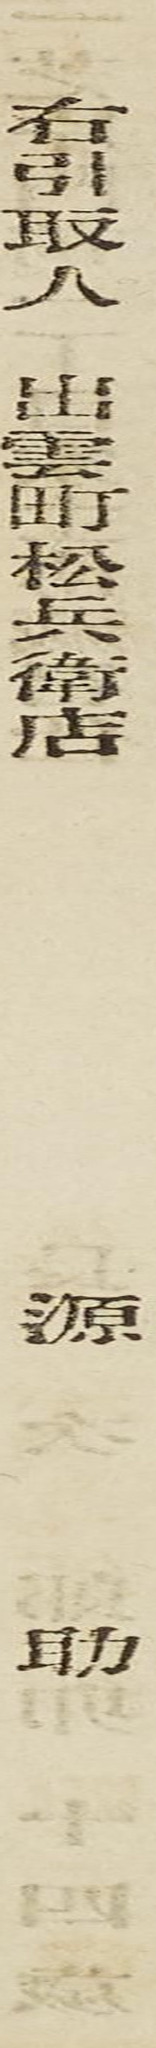右引取人出雲町松兵衛店源助
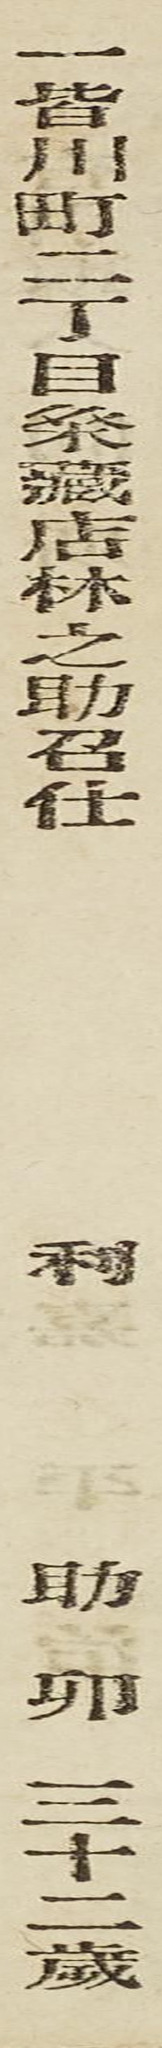一皆川町二丁目粂蔵店林之助召仕利助卯三十二歳
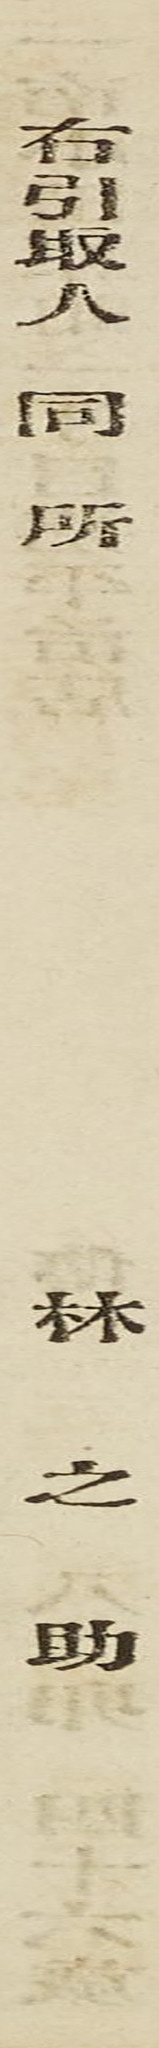右引取人同所林之助
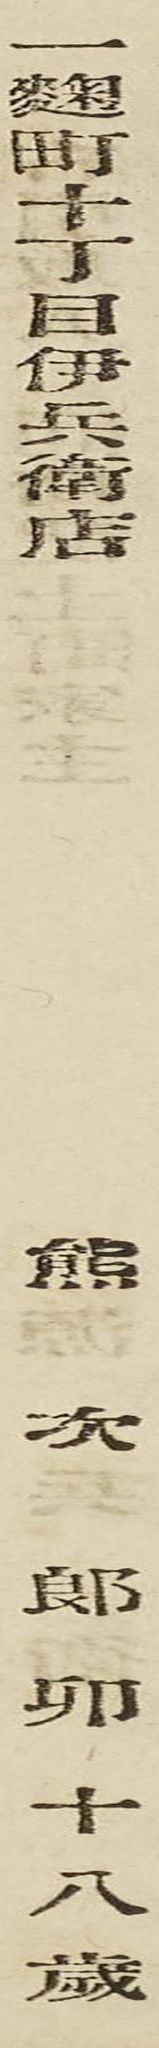一麹町十丁目伊兵衛店熊次郎卯十八歳
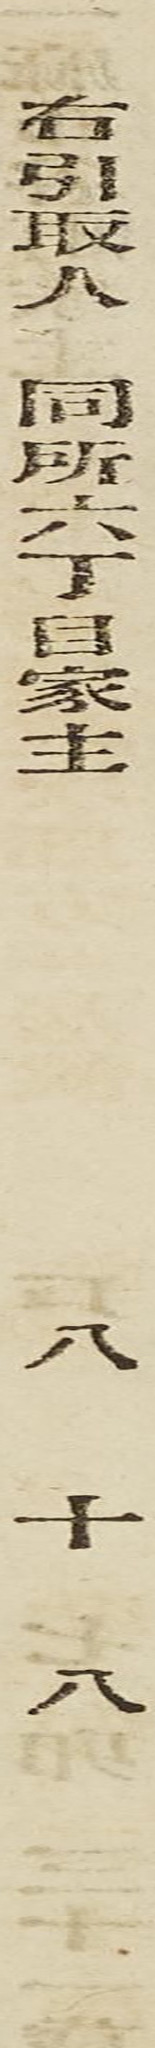右引取人同所六丁目家主八十八
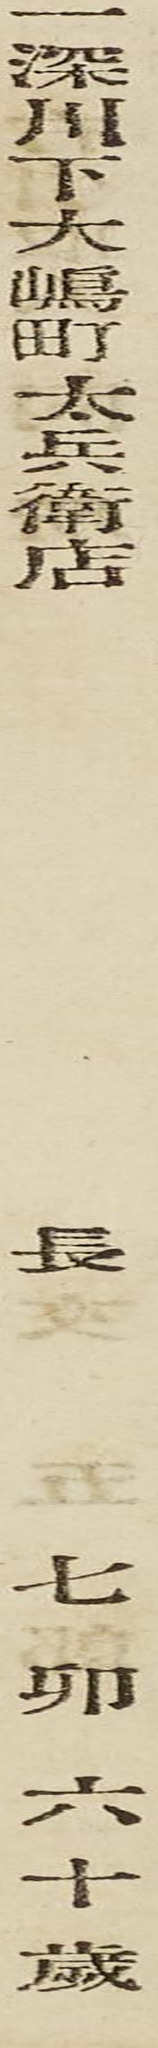一深川下大嶋町太兵衛店長七卯六十歳
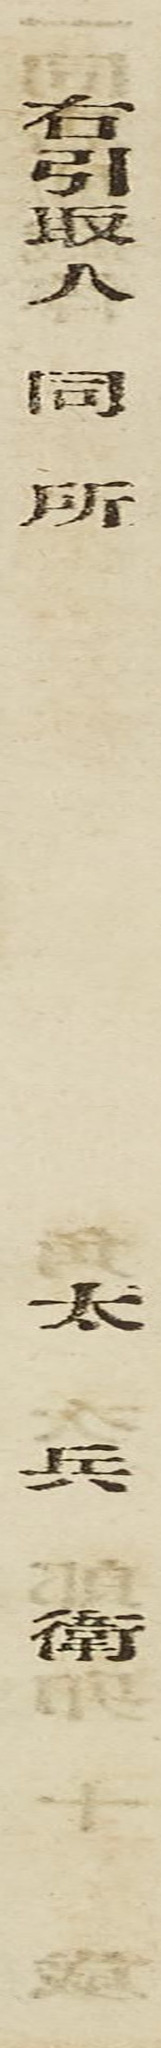右引取人同所太兵衛
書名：永代惨話　文化の夢　全
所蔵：東京大学地震研究所図書室 Earthquake Research Institute Library, The University of Tokyo, JAPAN
